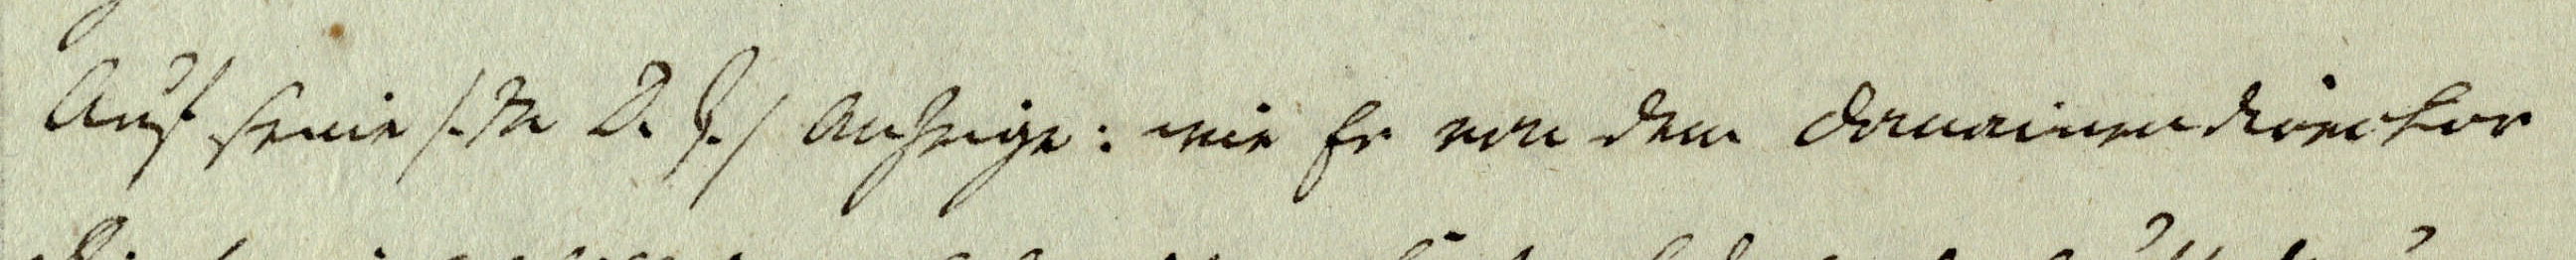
Auf seine /. M. D. R./ Anzeige: wie Er von dem Domainendirector
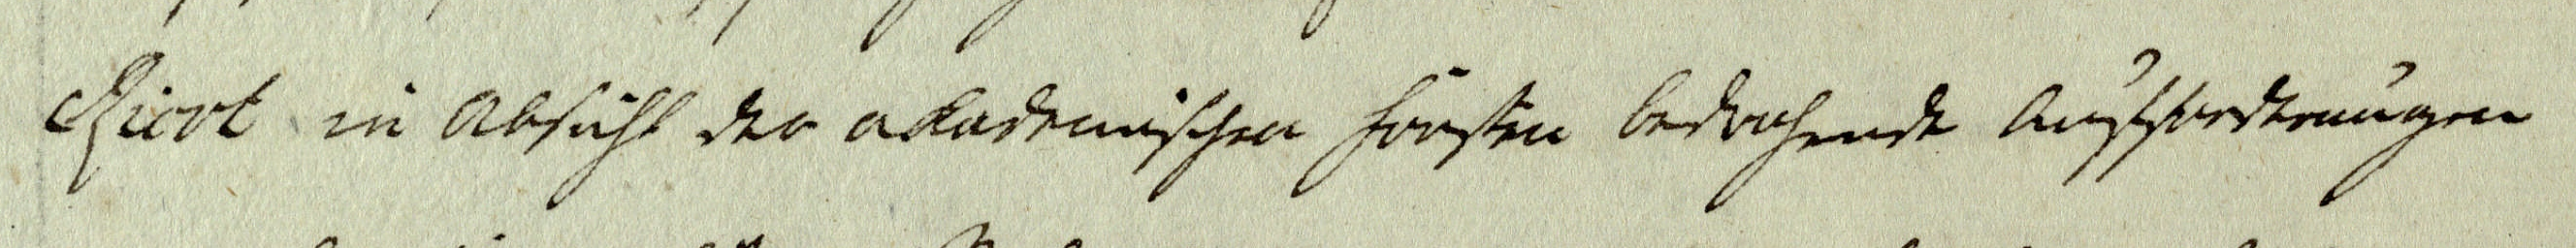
Ricot in Absicht der akademischen Forsten bedrohende Aufforderungen
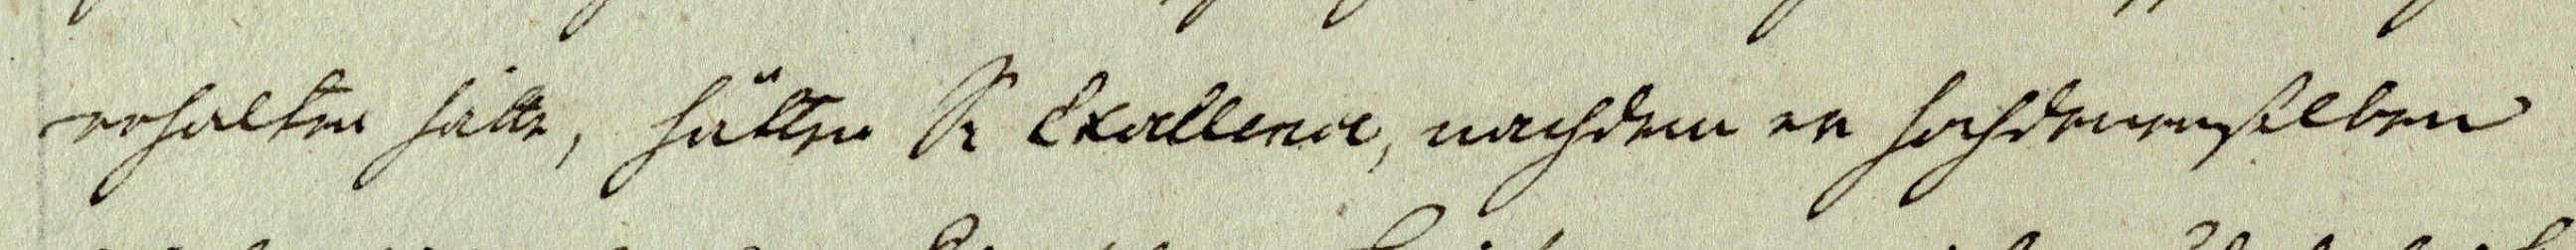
erhalten hätte, hätten Sr. Excellence, nachdem er hochdenenselben
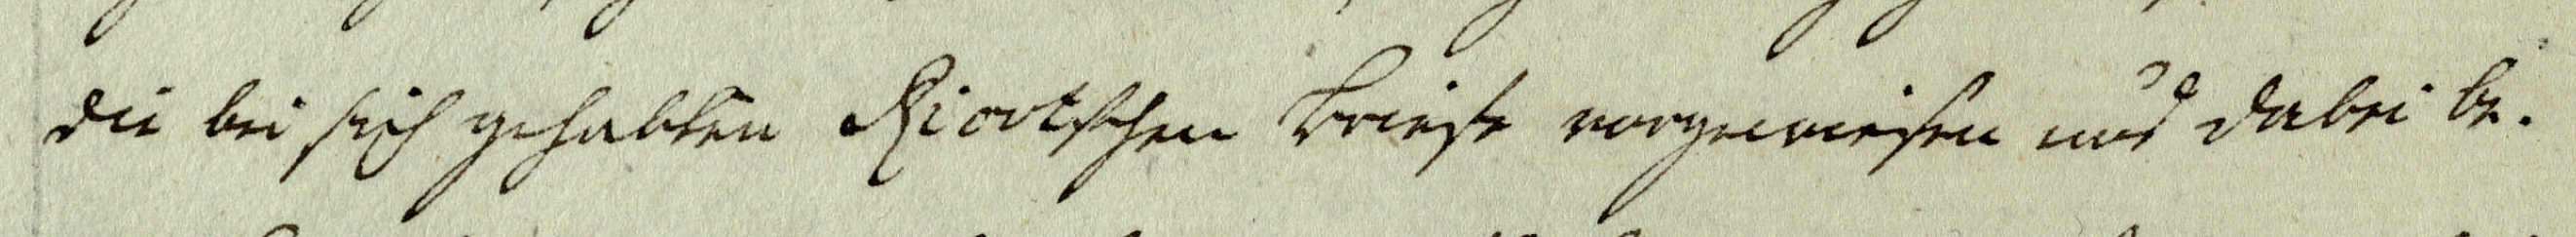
die bei sich gehalten Ricotschen Briefe vorgewiesen und dabei be¬
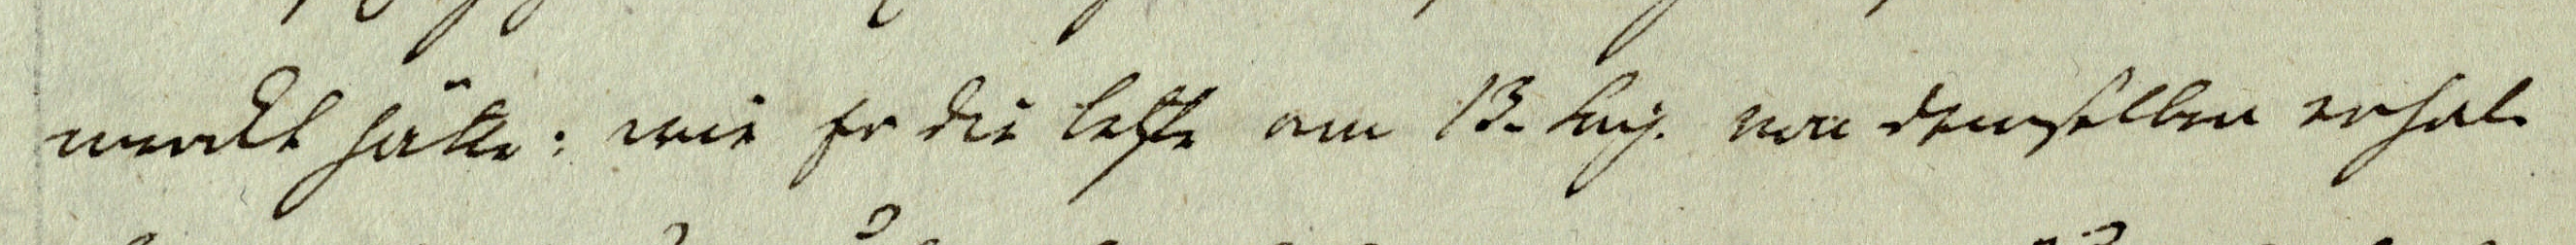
merckt hätte: wie Er die letzte am 13. huj. von demselben erhal¬
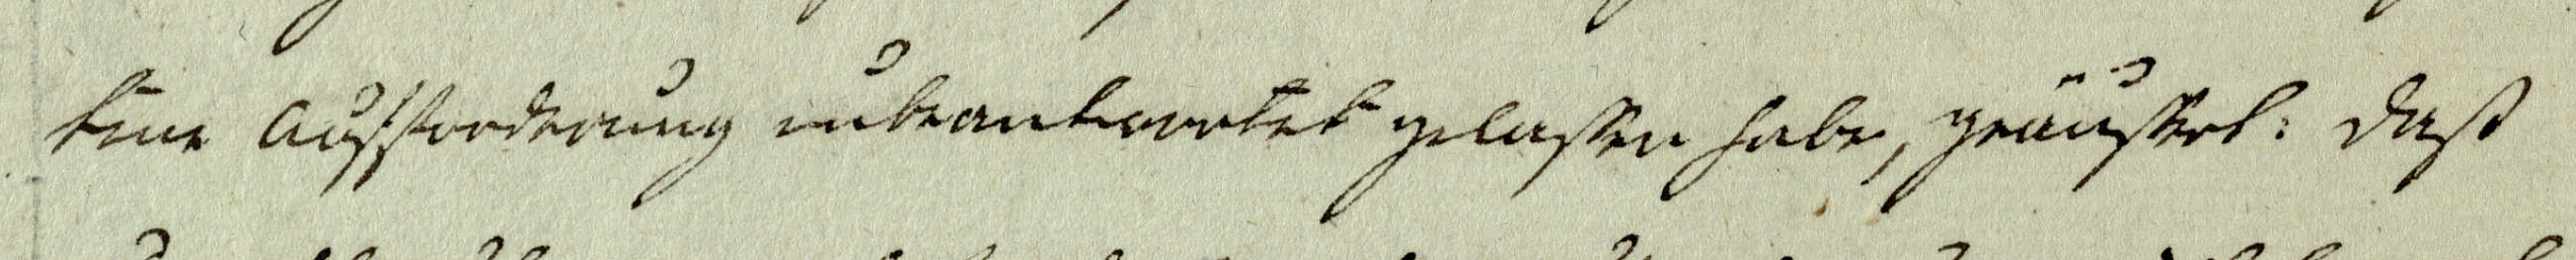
tene Aufforderung unbeantwortet gelassen habe, geäussert: daß
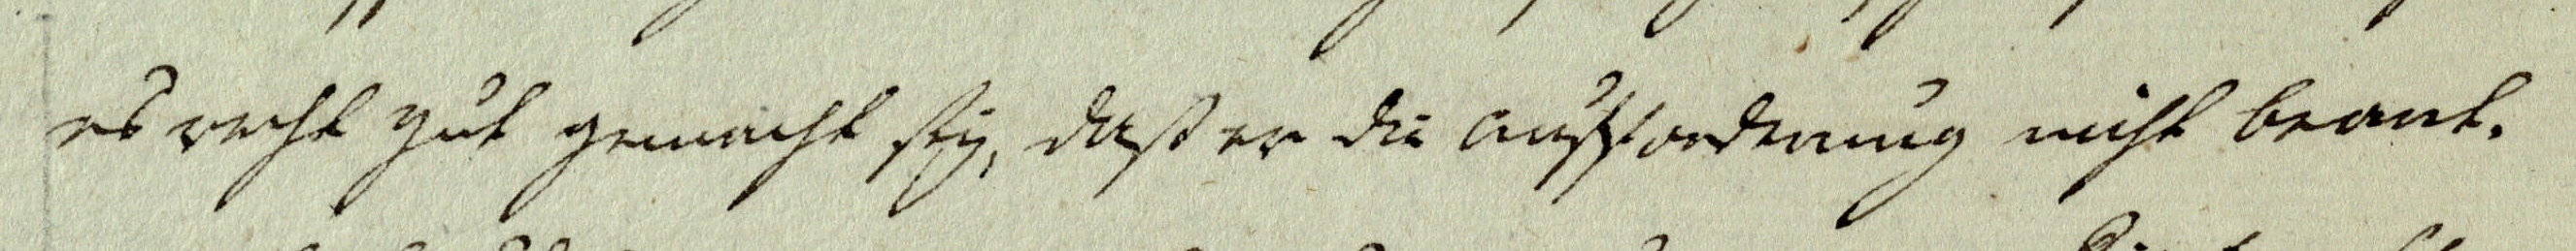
es recht gut gemacht seÿ, daß er die Aufforderung nicht beant¬
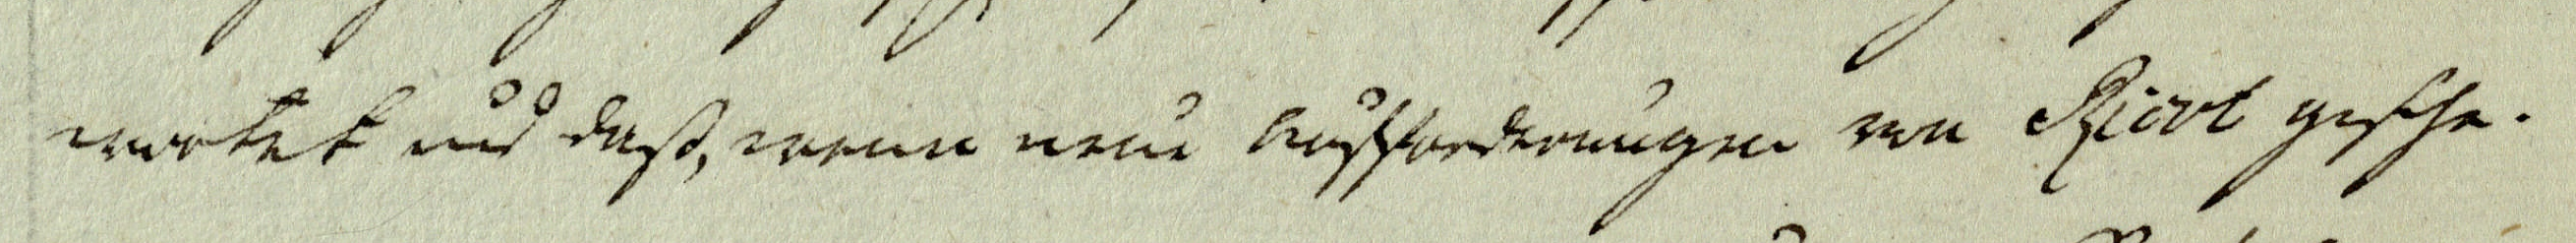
wortet und daß, wenn neue Aufforderungen von Ricot gesche¬
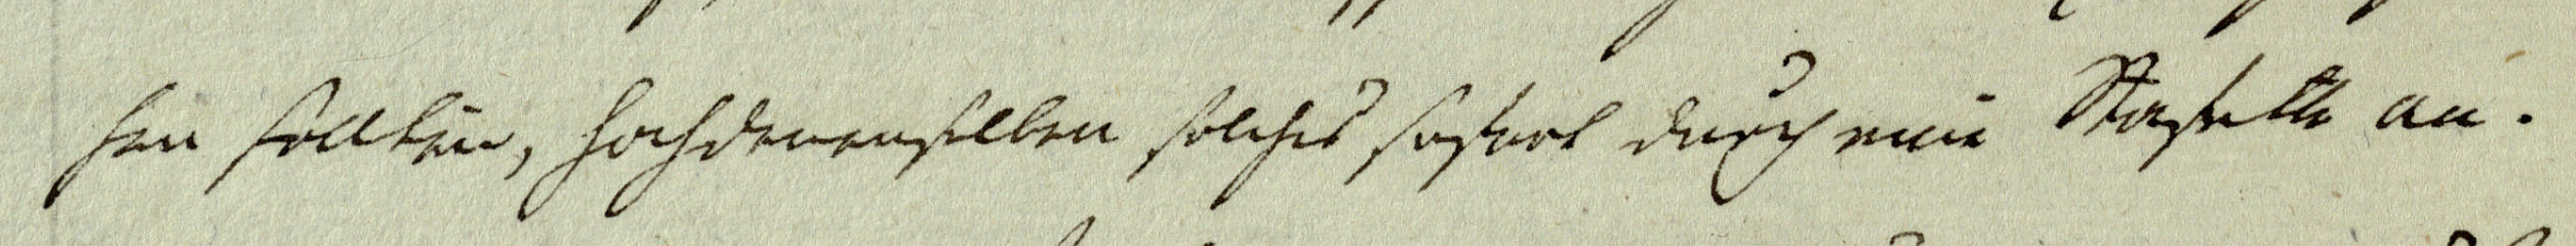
hen sollten, hochdenenselben solches sofort durch eine Stafette an¬
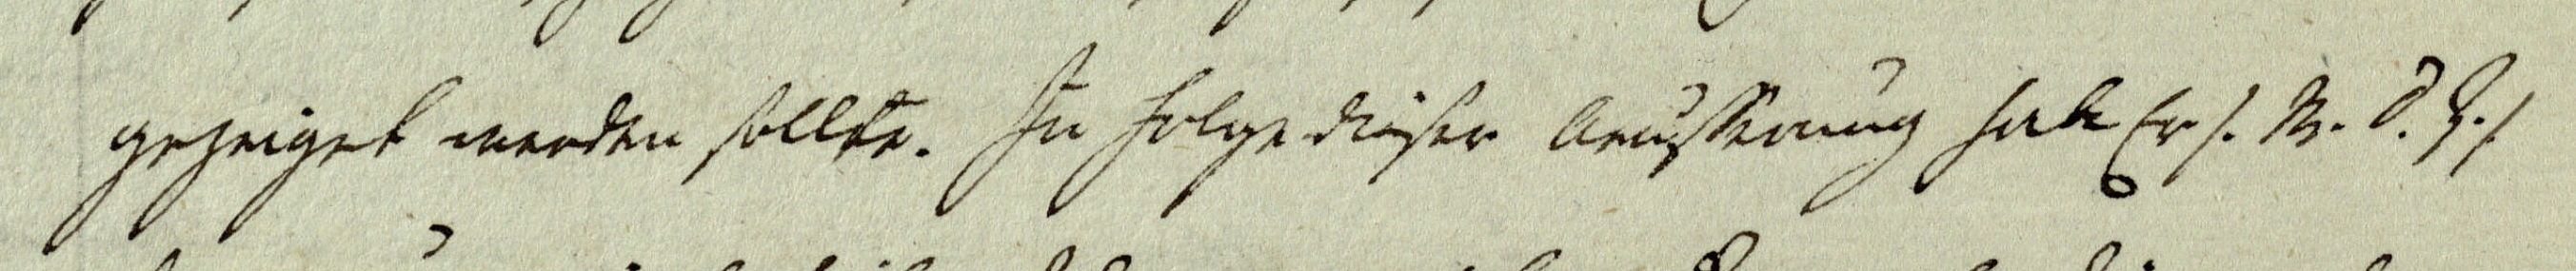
gezeiget werden sollte. In Folge dieser Aeusserung habe Er /. M. D. R./
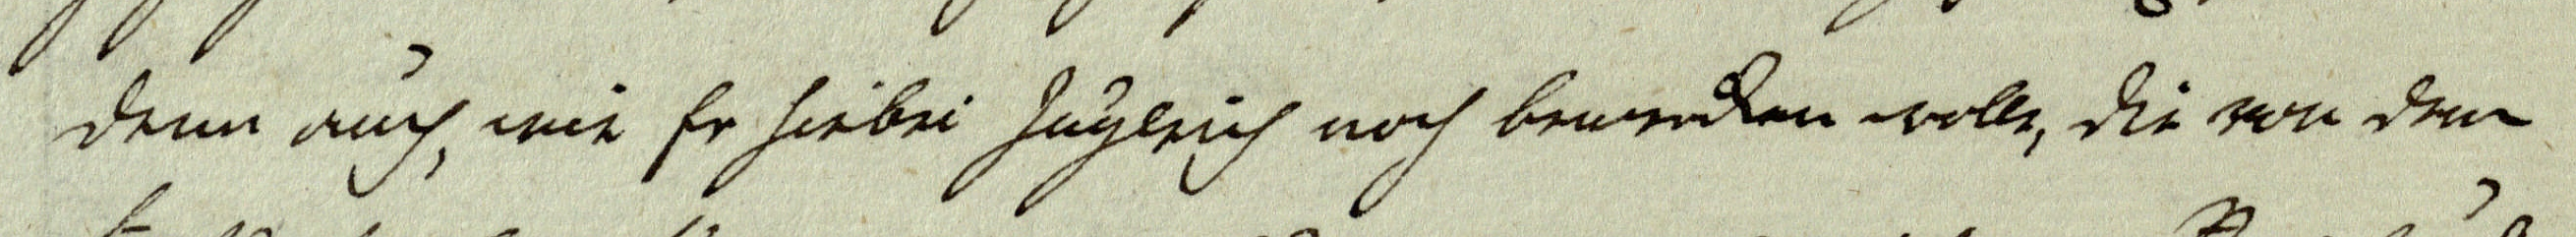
denn auch, wie Er hiebei zugleich noch bemercken wolle, die von dem
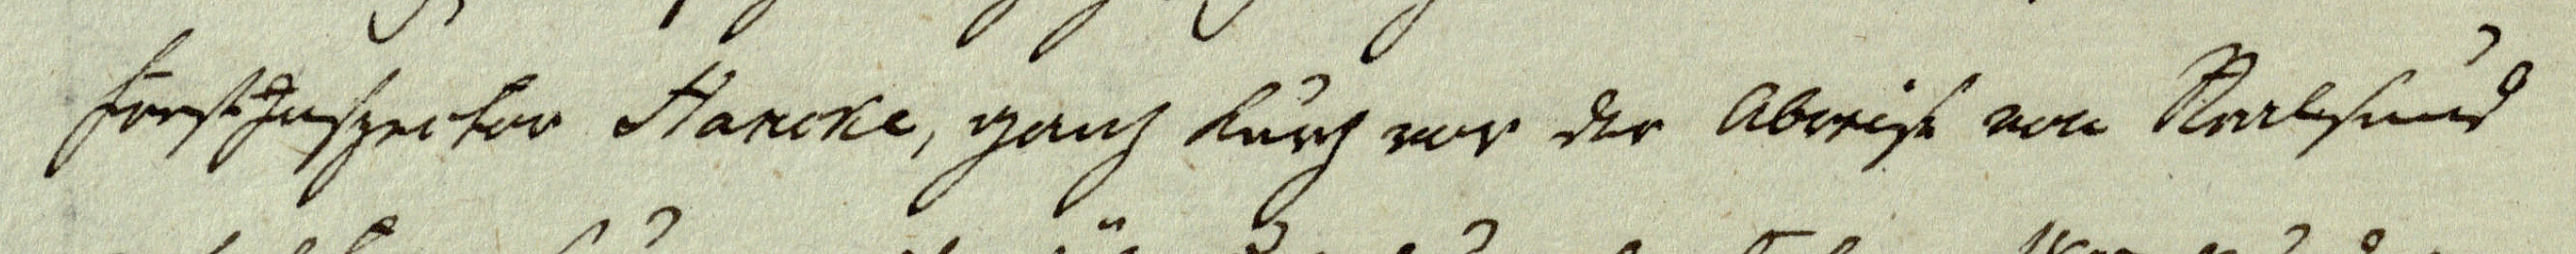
ForstInspector Hancke, ganz kurz vor der Abreise von Stralsund
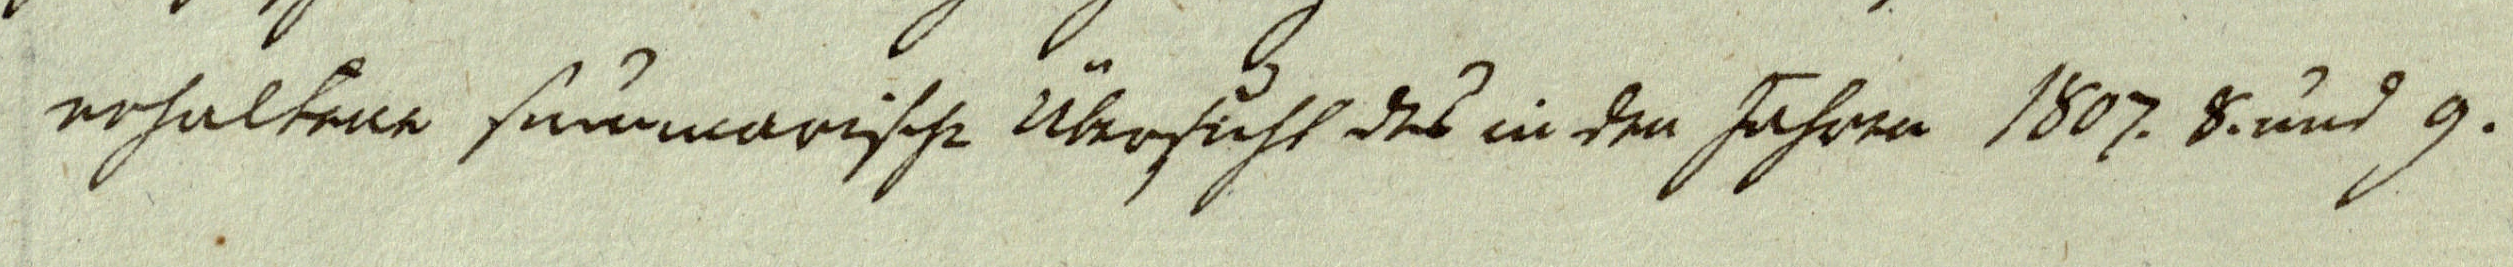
erhaltene summarische Übersicht des in den Jahren 1807. 8. und 9.
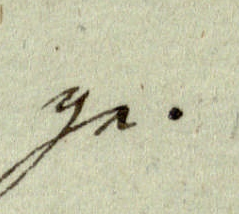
ge¬
